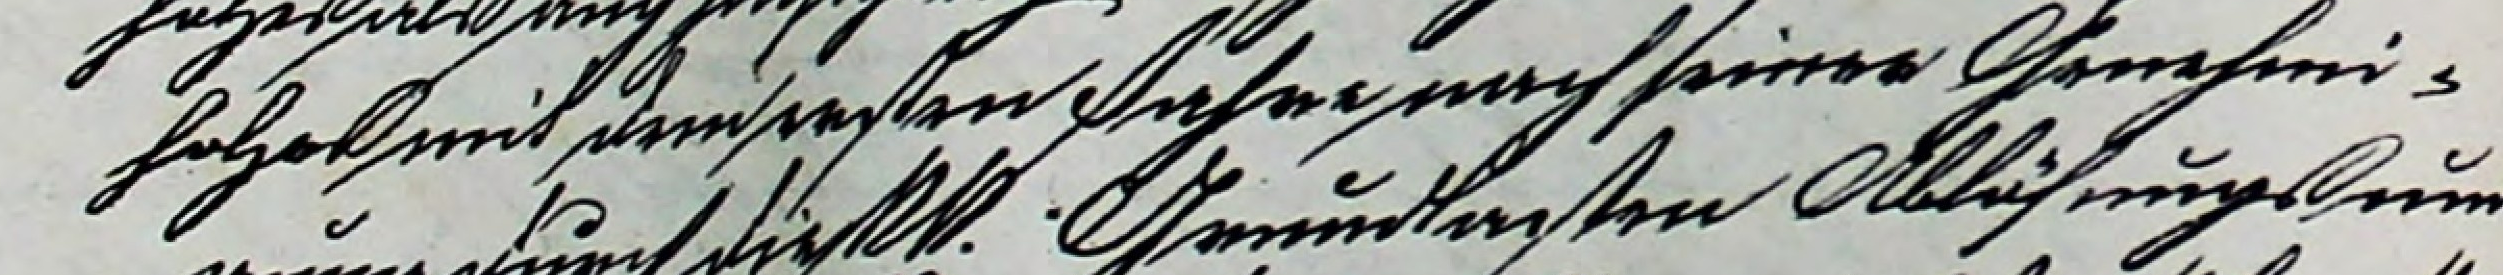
holzes mit dem ersten Jahre nach seiner Genehmi„
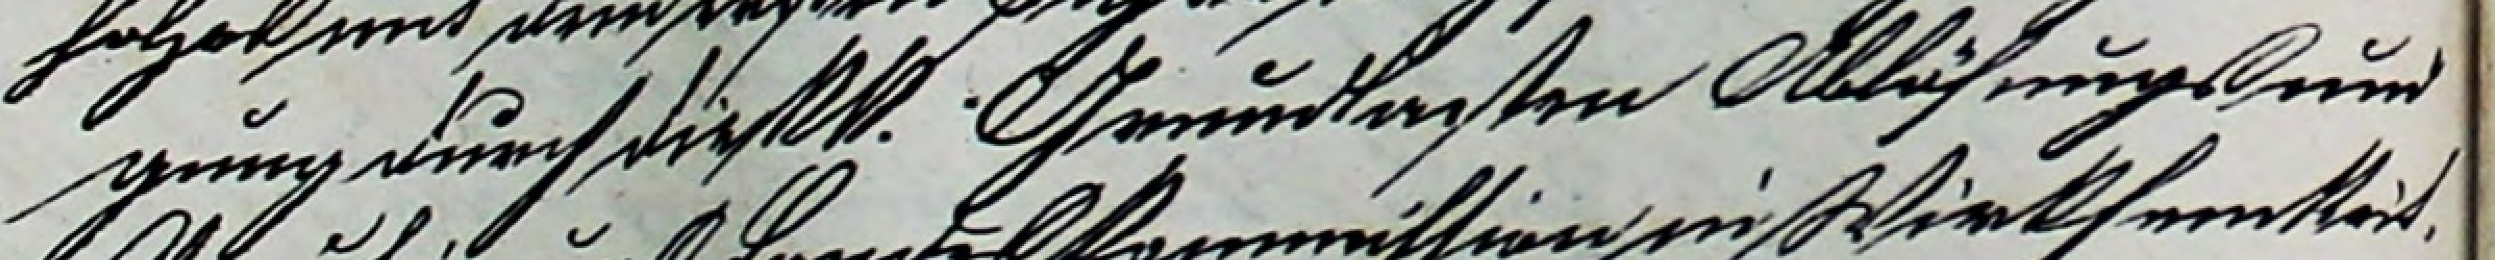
gung durch die kk. Grundlasten Ablösungs und
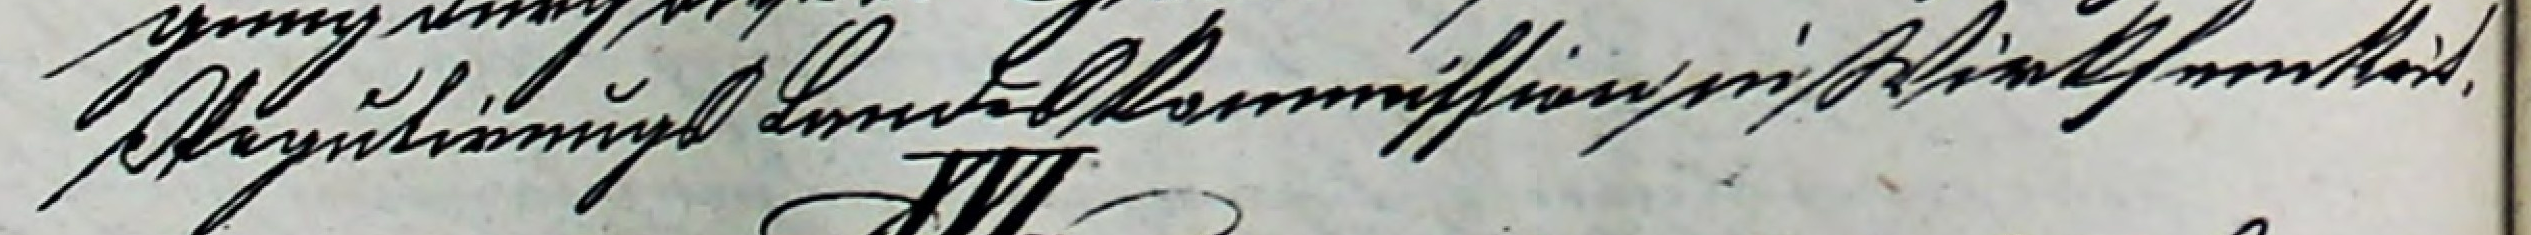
Regulirungs Landes Kommission in Wirkhemkört.
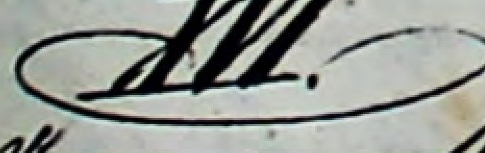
XVI.
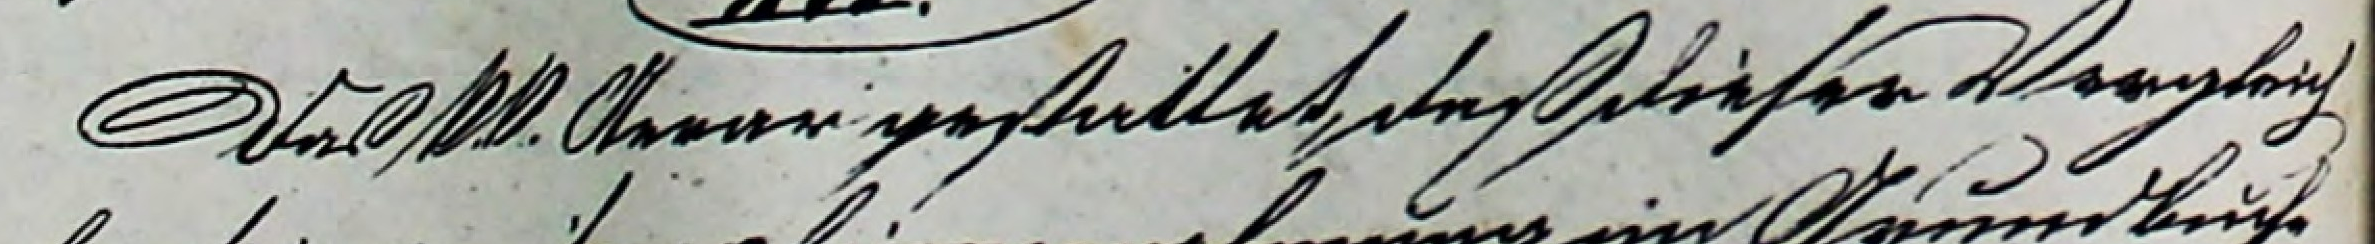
Das k.k. Aerar gestattet, daß dieser Vergleich
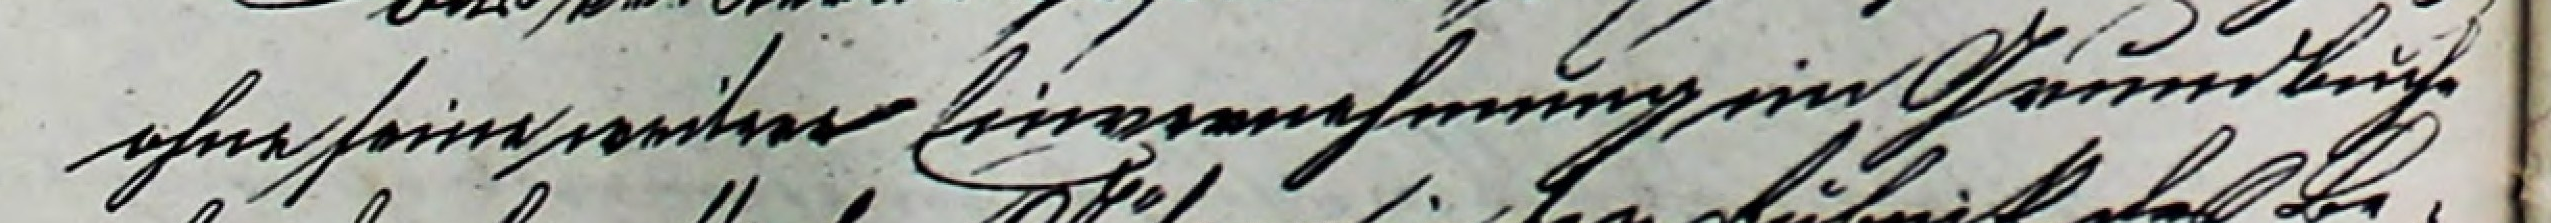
ohne seine weitere Einvernehmung im Grundbuche
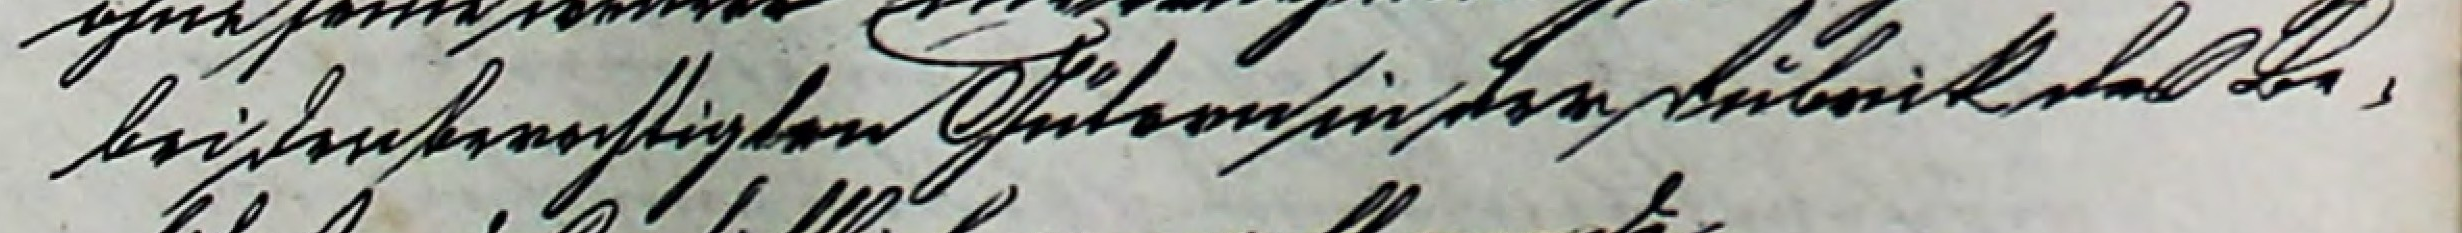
bei den berechtigten Gutern in der dubrick des Be„
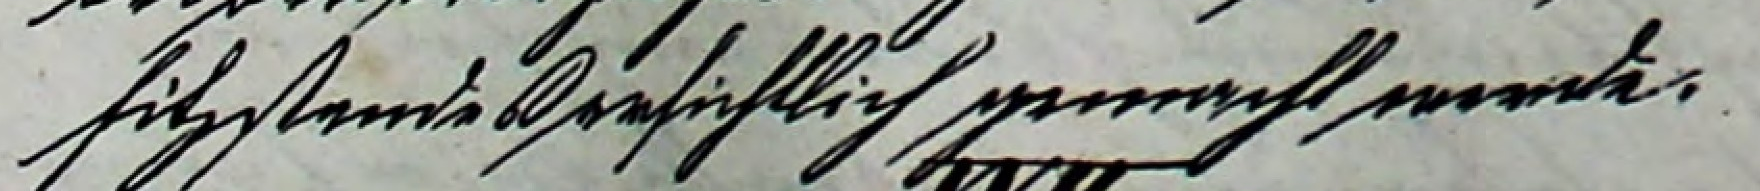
sitzstande ersichtlich gemacht werde.
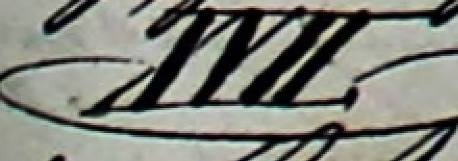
XVII.
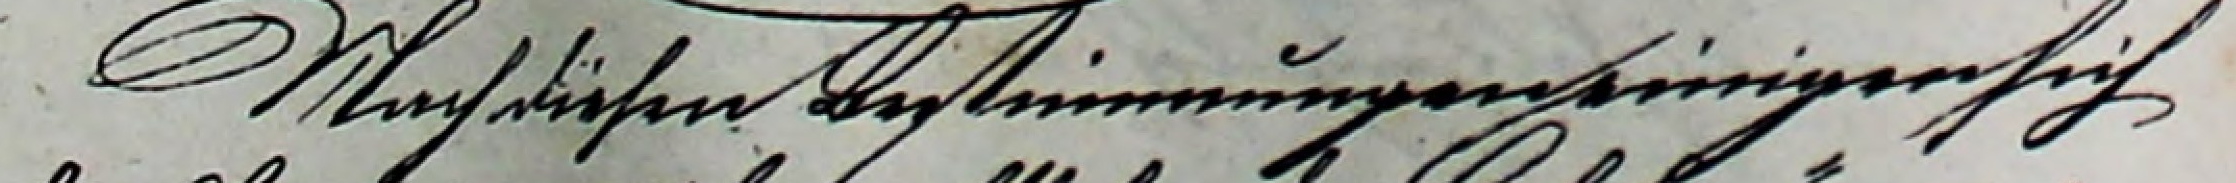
Nach diesen Bestimmungen einigen sich
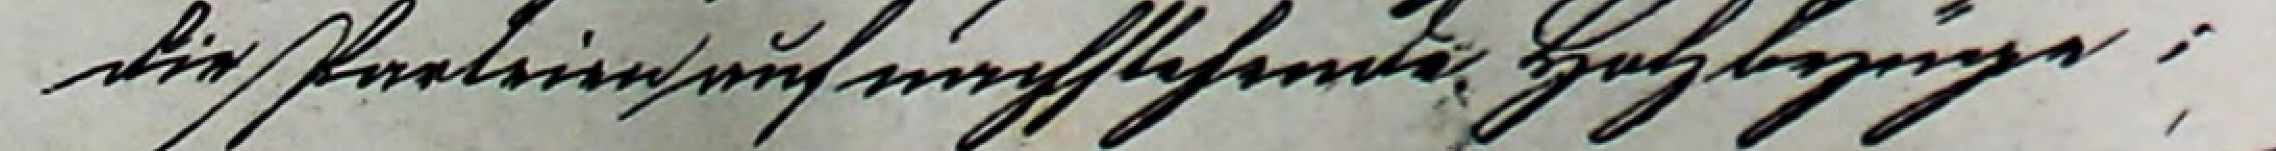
die Parteien auf nachstehende Holzbezüge;
